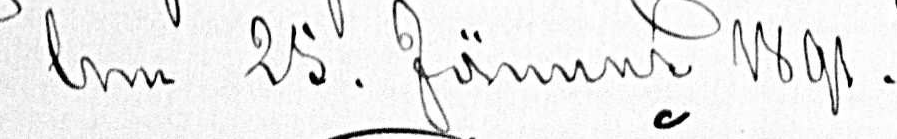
Am 25. Jänner 1891
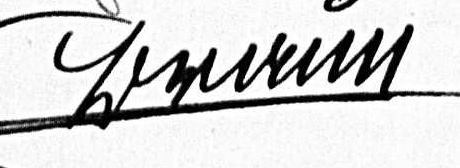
Braun
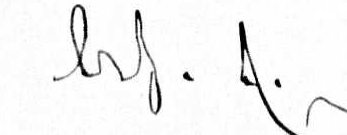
Ah E.
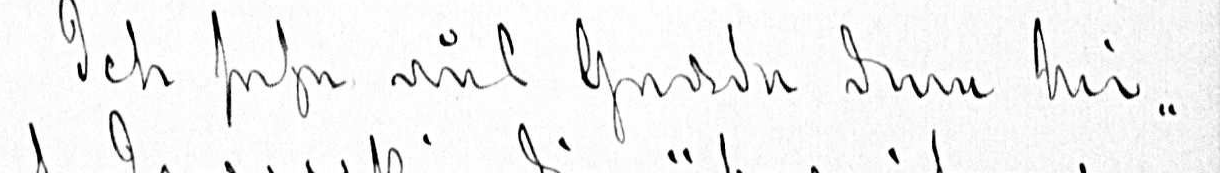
Ich sehe aus Gnade dem Mi¬
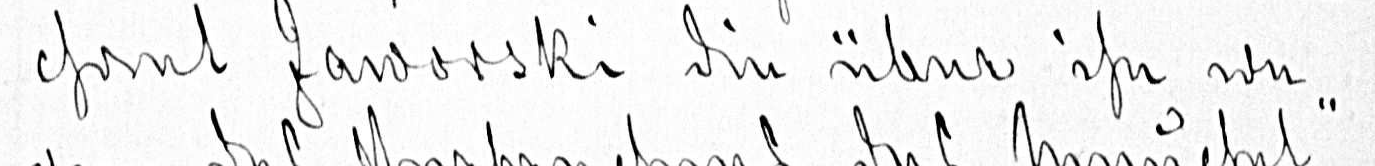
chael Jaworski die über ihn we¬
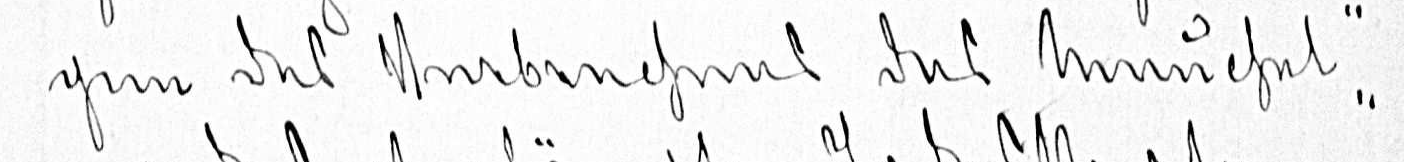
gen des Verbrechens des Meuchel¬
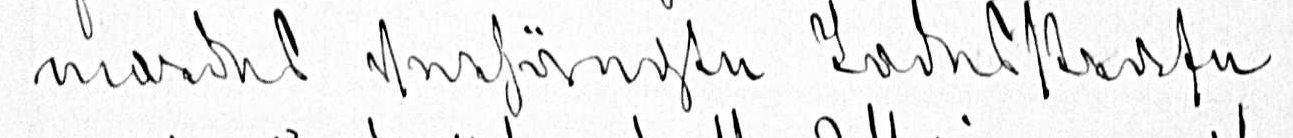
mordes verhängte Todesstrafe
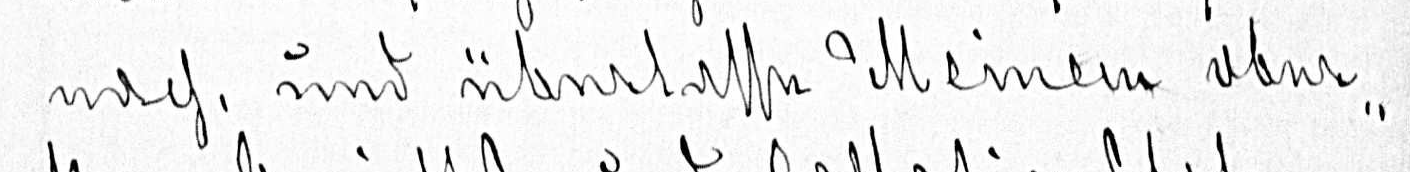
nach, und überlasse Meinem ober¬
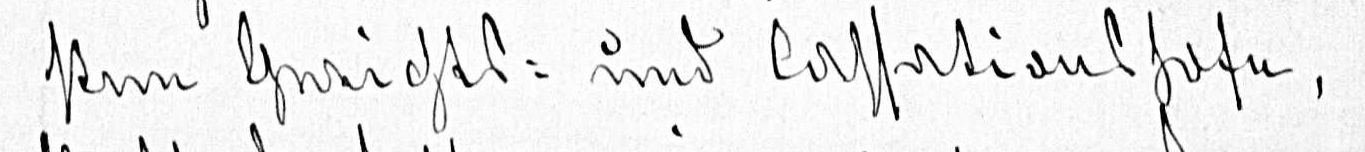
sten Gerichts- und Cassationshofe,
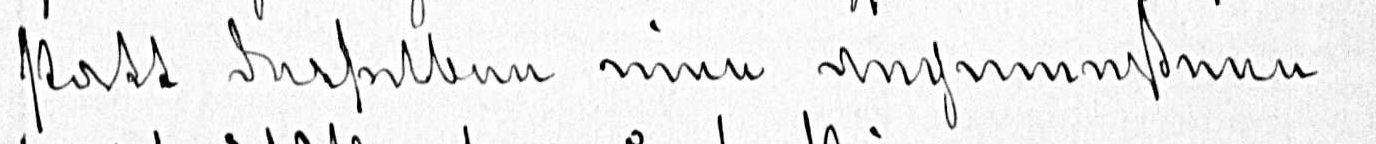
statt derselben eine angemeßene
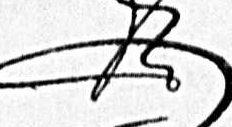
FJ
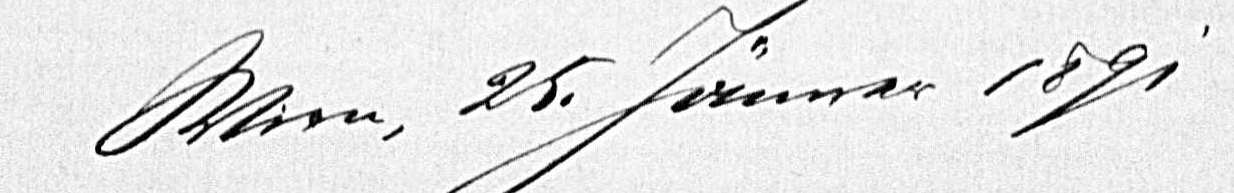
Wien, 25. Jänuer 1891.
